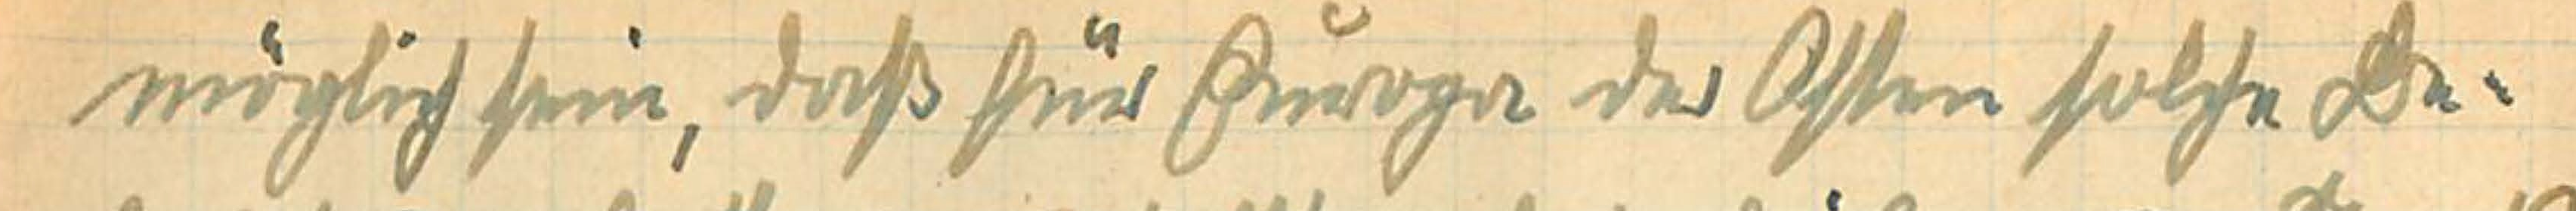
möglich sein, daß für Europa der Osten solche Be-
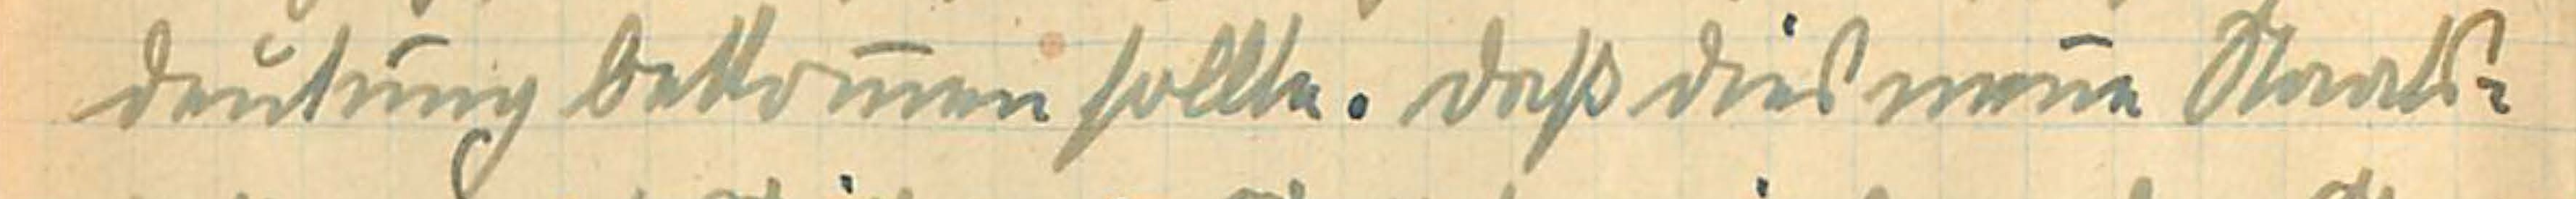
deutung bekommen sollte. Daß dies neue Staats-
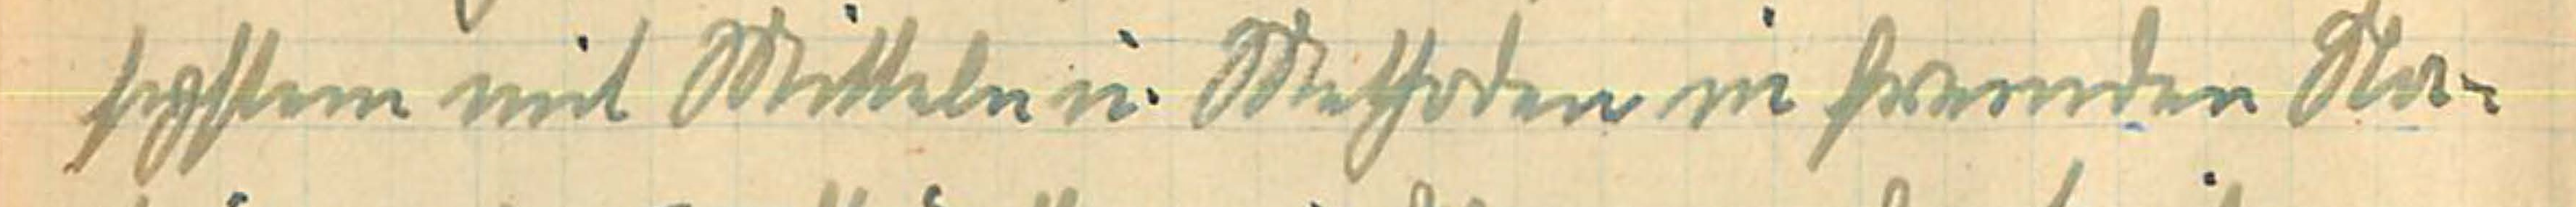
system mit Mitteln u. Methoden in fremden Na-
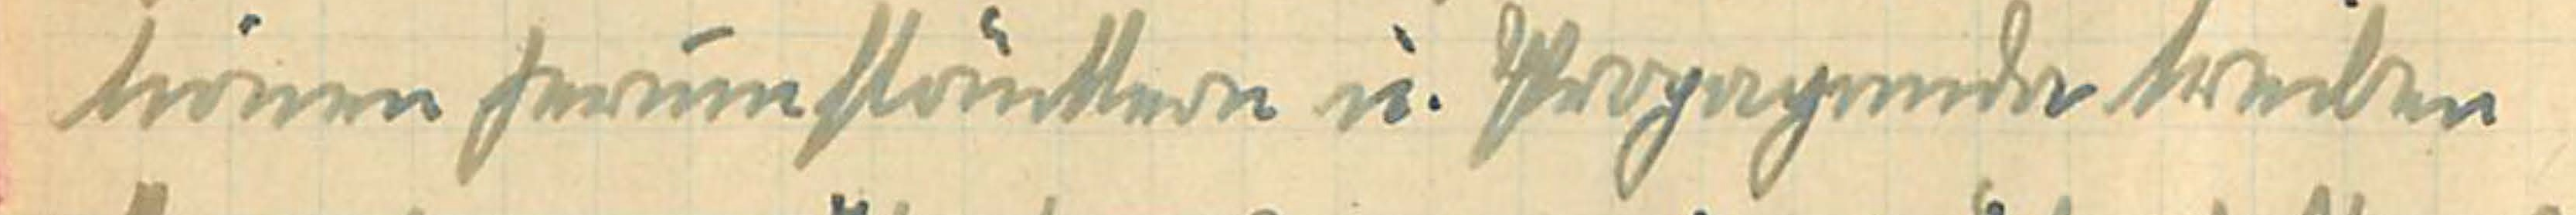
tionen herumstänkern u. Propaganda treiben
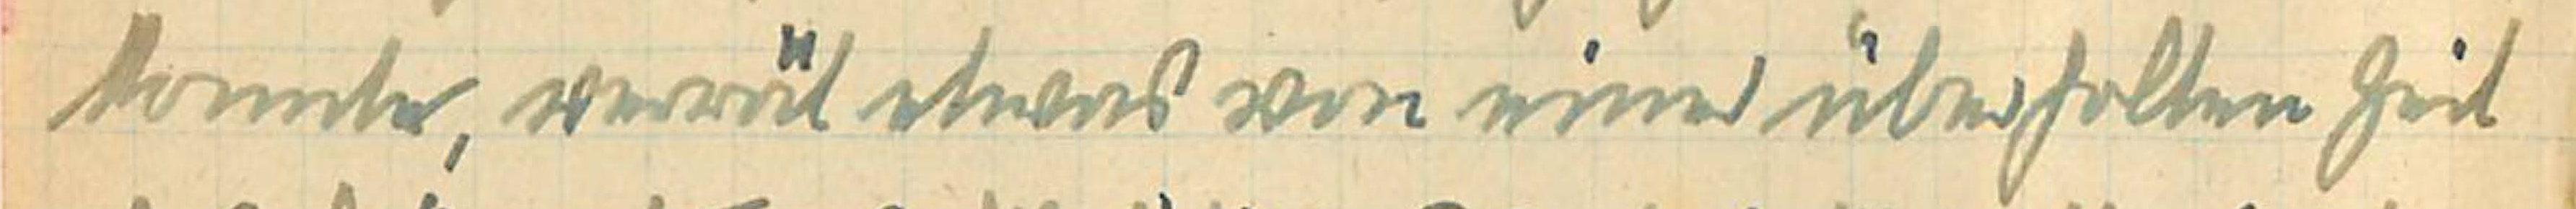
konnte, verrät etwas von einer überholten Zeit
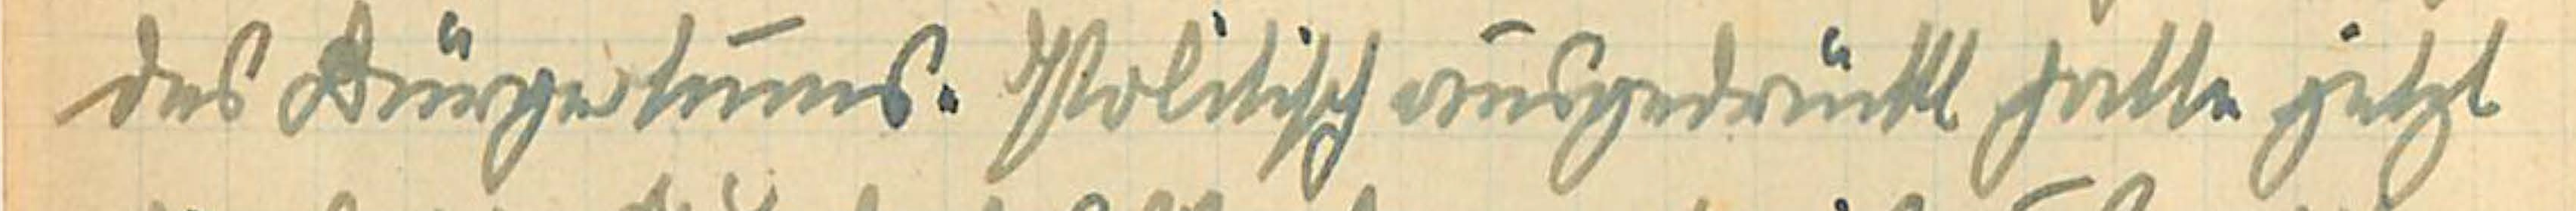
des Bürgertums. Politisch ausgedrückt hatte jetzt
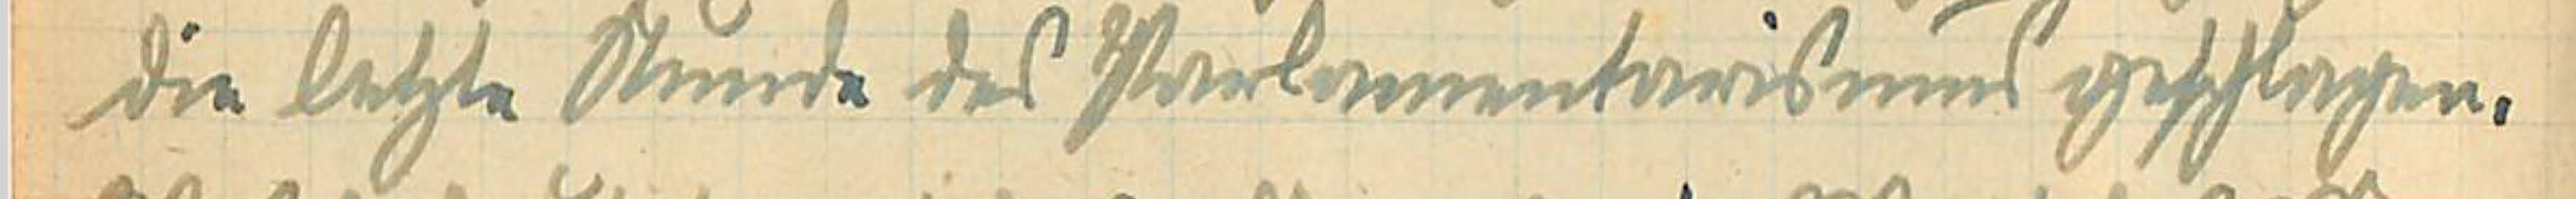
die letzte Stunde des Parlamentarismus geschlagen.
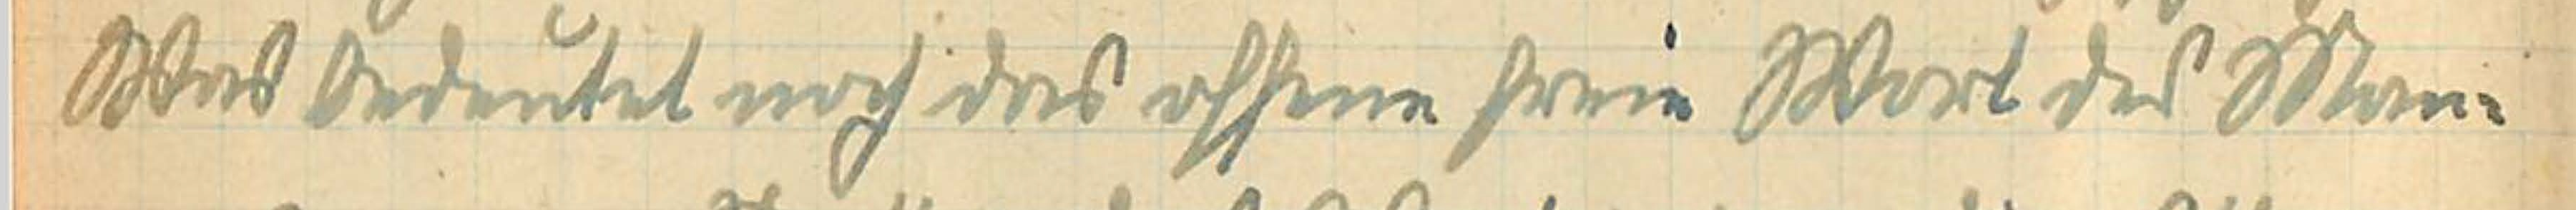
Was bedeutet noch das offene freie Wort des Man-
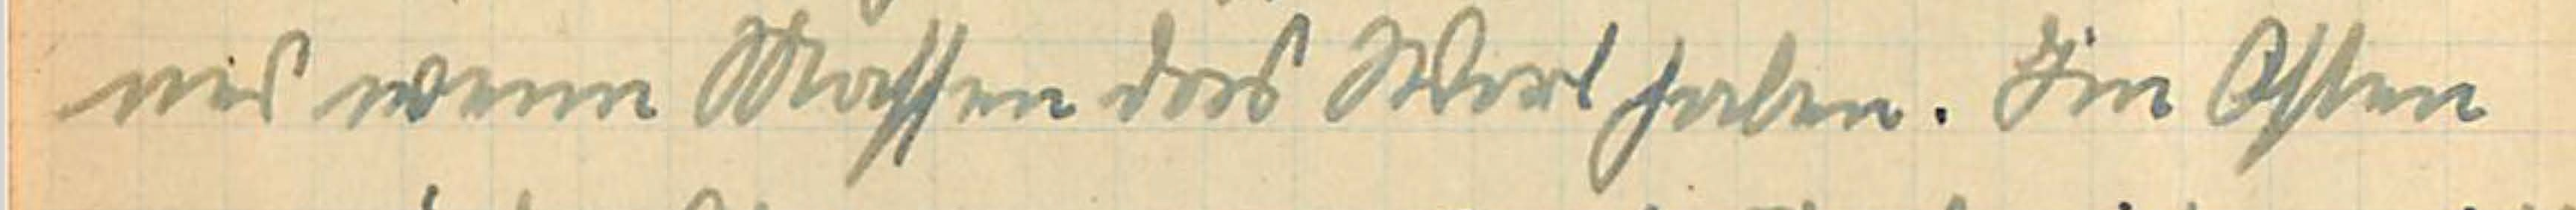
nes wenn Massen das Wort haben. Im Osten
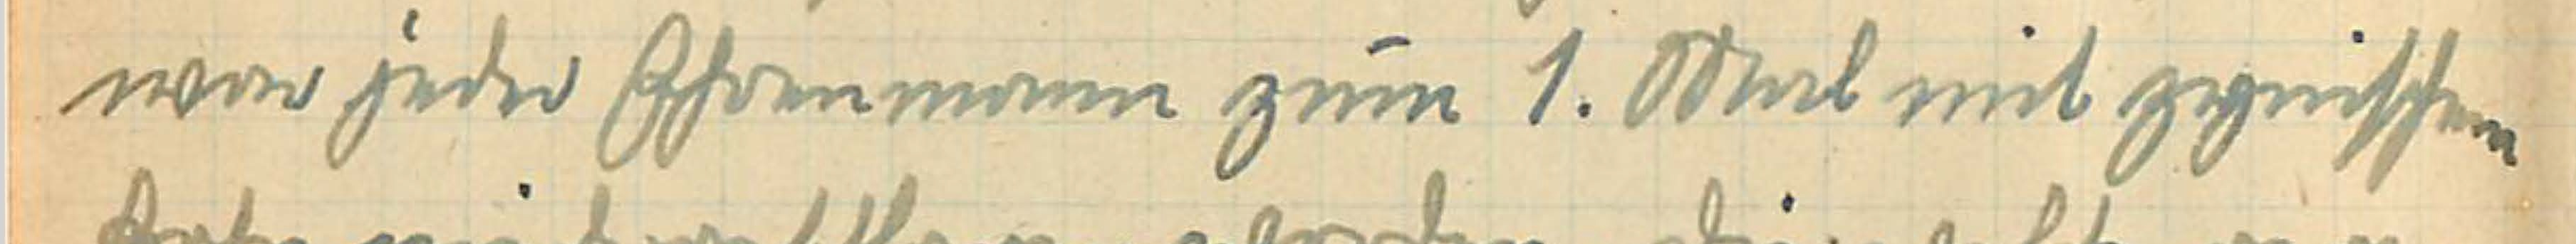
war jeder Ehrenmann zum 1. Mal mit zynischem
